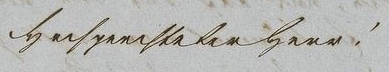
Hochgeachteter Herr!
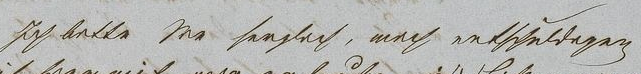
Ich bitte Sie herzlich, mich entschuldigen
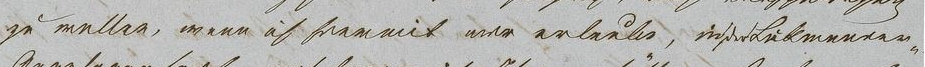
zu wollen, wenn ich hiemit mir erlaube, in der Lukmanier--
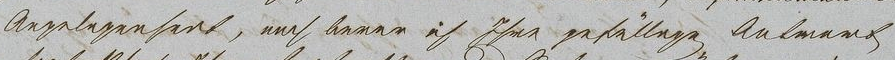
Angelegenheit, noch bevor ich Ihre gefällige Antwort
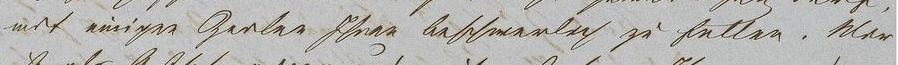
mit einigen Zeilen Ihnen beschwerlich zu fallen. Mir
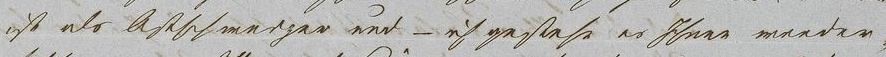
ist als Ostschweizer und – ich gestehe es Ihnen wieder-
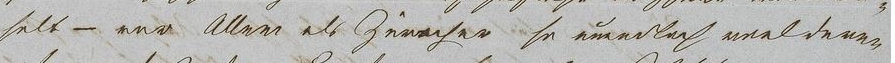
holt – vor allem als Zürcher so unendlich viel daran
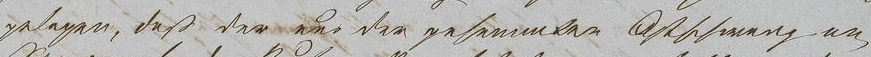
gelegen, daß der aus der gesammten Ostschweiz an
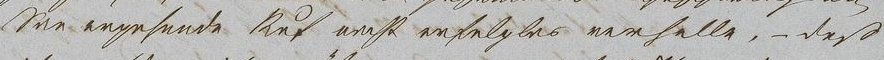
Sie ergehende Ruf nicht erfolglos verhalle, – daß
